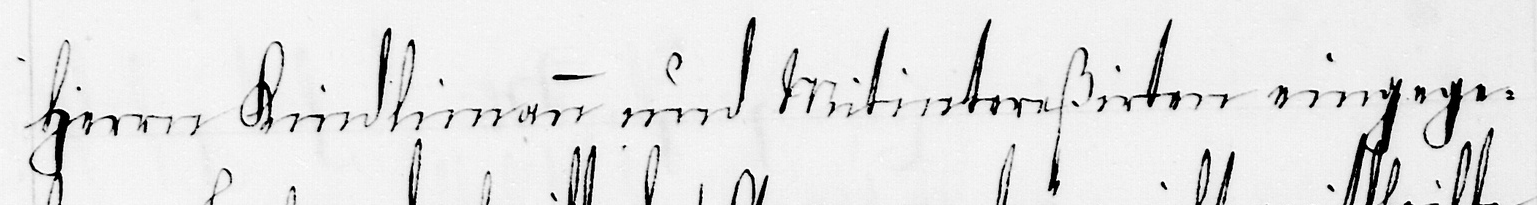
Herrn Kindlimann und Mitintereßirten eingege¬
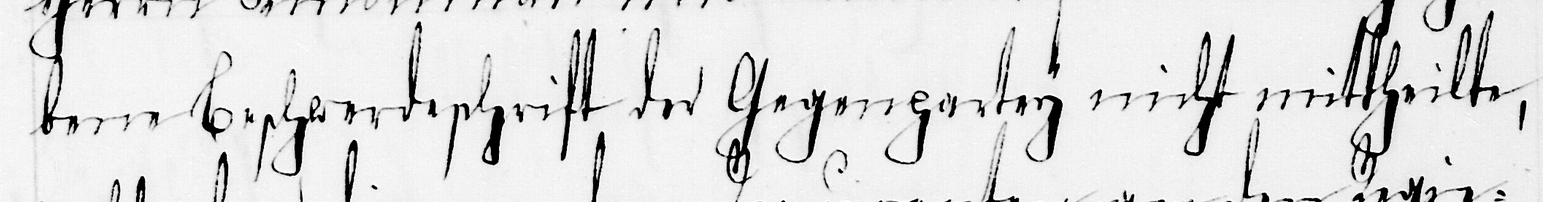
bene Beschwerdeschrift der Gegenpartey nicht mittheilte,
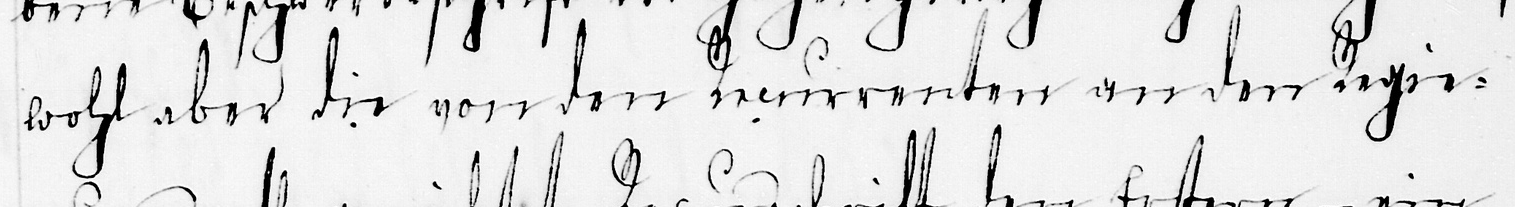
wohl aber die von den Recurrenten an den Regie¬
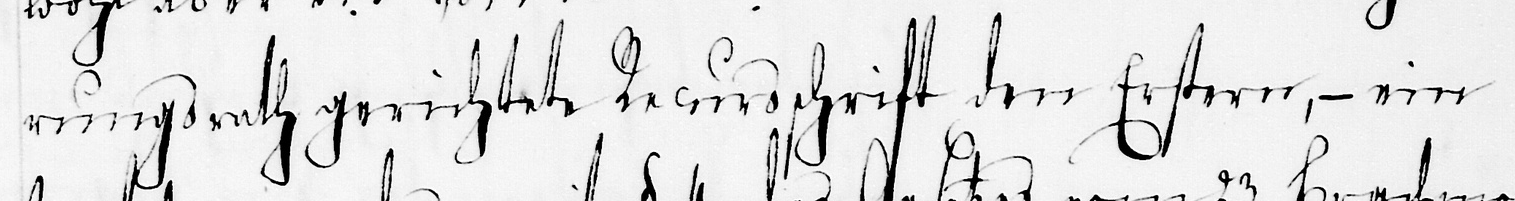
rungsrath gerichtete Recursschrift den Erstern, – ein
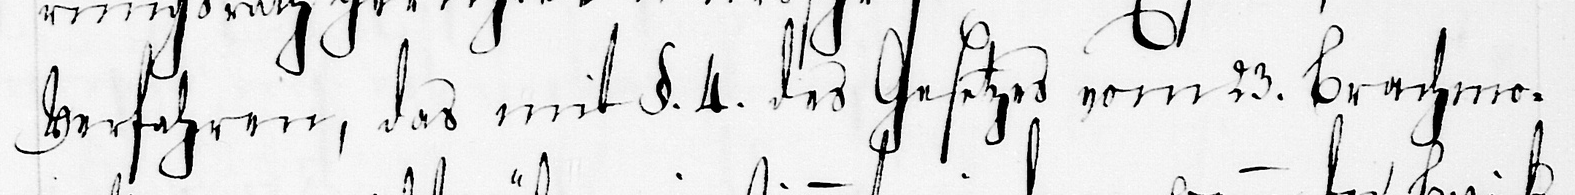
Verfahren, das mit §. 4. des Gesetzes vom 23. Brachmo¬
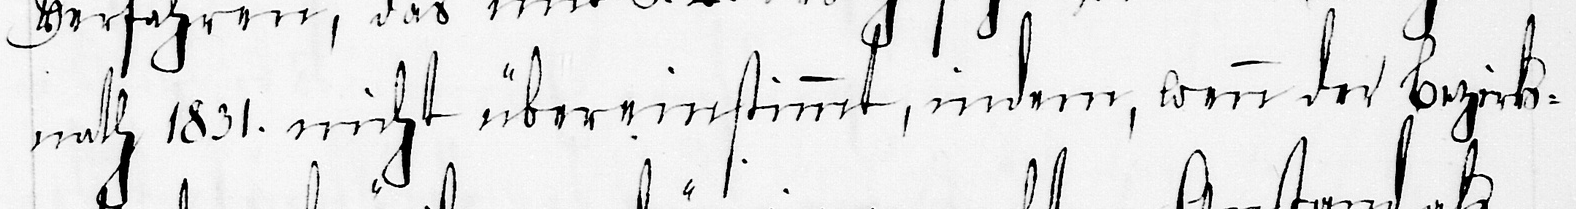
nath 1831. nicht übereinstimmt, indem, wenn der Bezirks¬
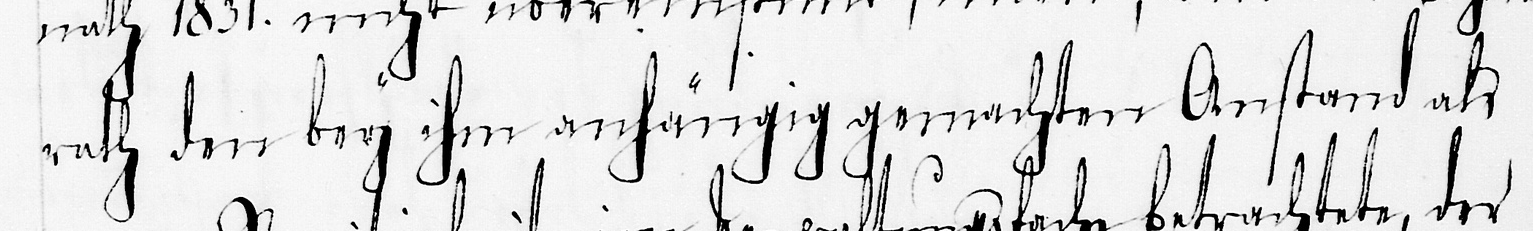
rath den bey ihm anhängig gemachten Anstand als
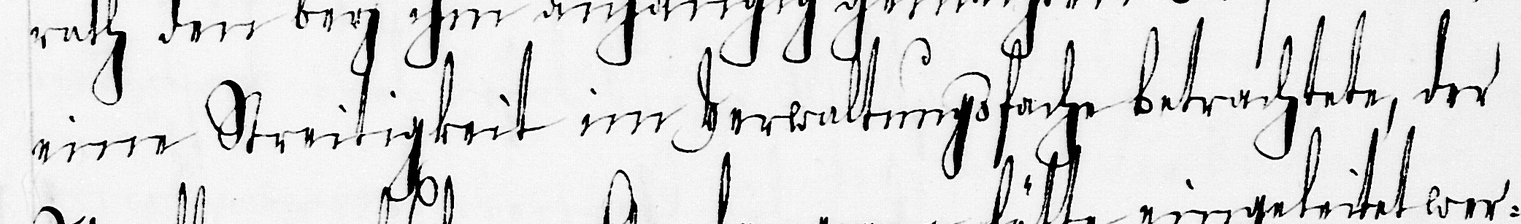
eine Streitigkeit im Verwaltungsfache betrachtete, der
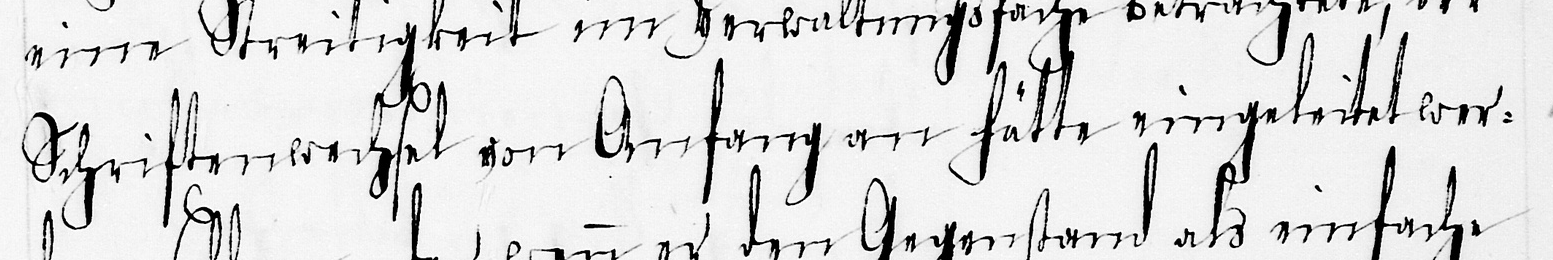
Schriftenwechsel von Anfang an hätte eingeleitet wer¬
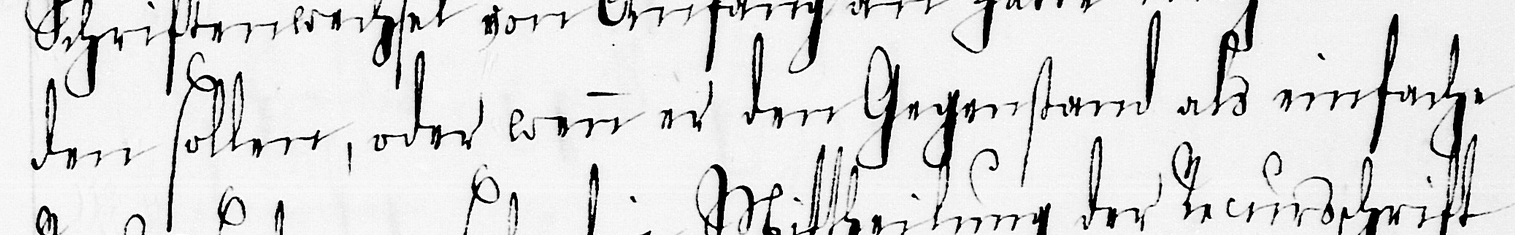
den sollen, oder wenn er den Gegenstand als einfache
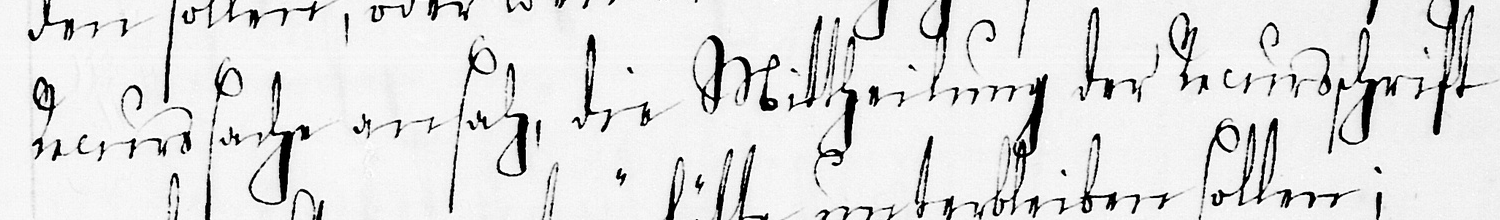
Recurssache ansah, die Mittheilung der Recursschrift
